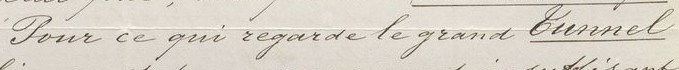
Pour ce qui regarde le grand Tunnel
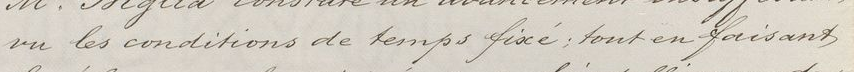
vu les conditions de temps fixé; tout en faisant
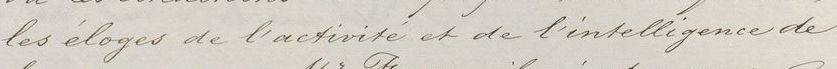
les éloges de l'activité et de l'intelligence de
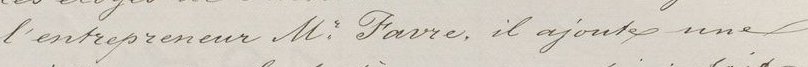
l'entrepreneur MrFavre, il ajoute une
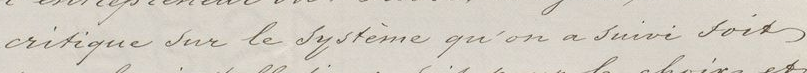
critique sur le système qu'on a suivi soit
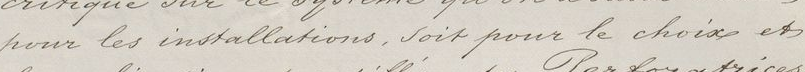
pour les installations, soit pour le choix et
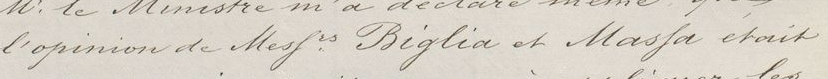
l'opinion de MessrsBiglia et Massa était
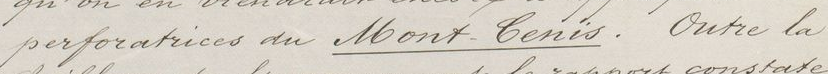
perforatrices du Mont-Cenis. Outre la
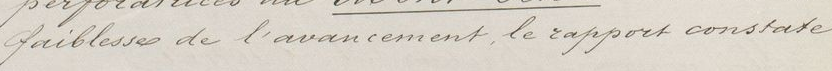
faiblesse de l'avancement, le rapport constate
